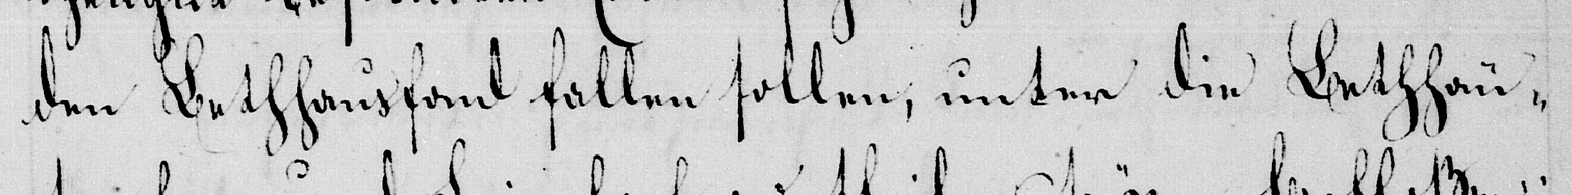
den Bethhausfond fallen sollen, unter die Bethhäu¬
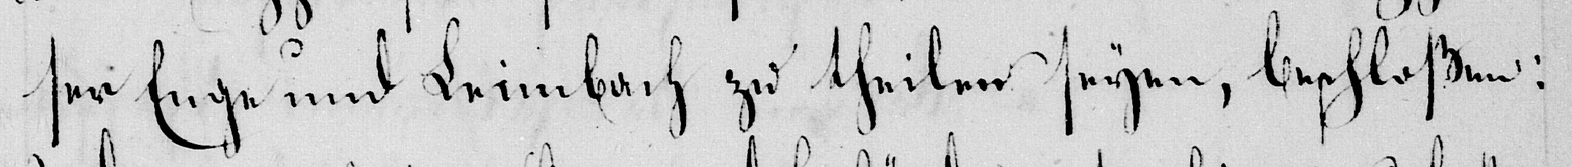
ser Enge und Leimbrach zu theilen seyen, beschloßen:
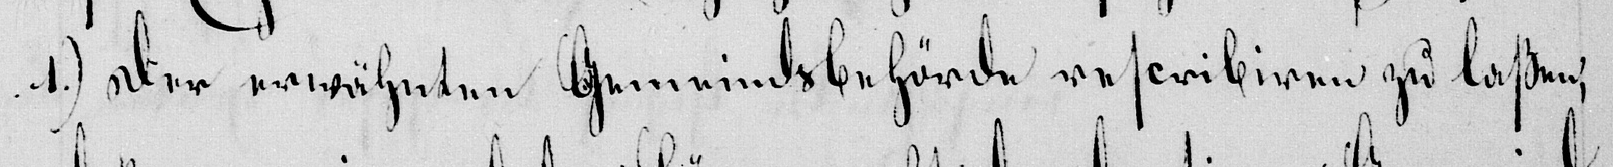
1.) Der erwähnten Gemeindsbehörde rescribiren zu laßen,
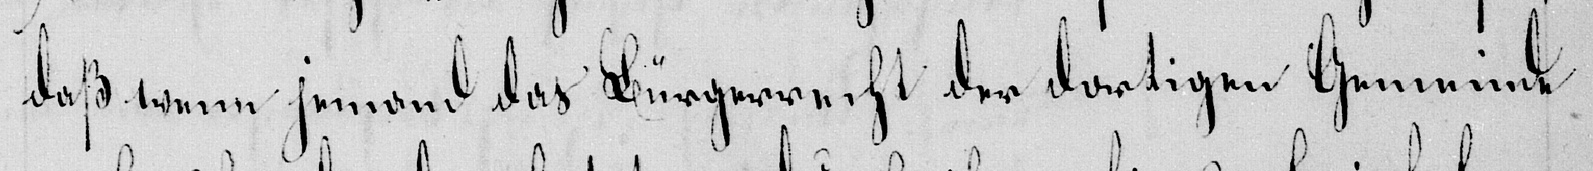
daß wenn jemand das Bürgerrecht der dortigen Gemeinde
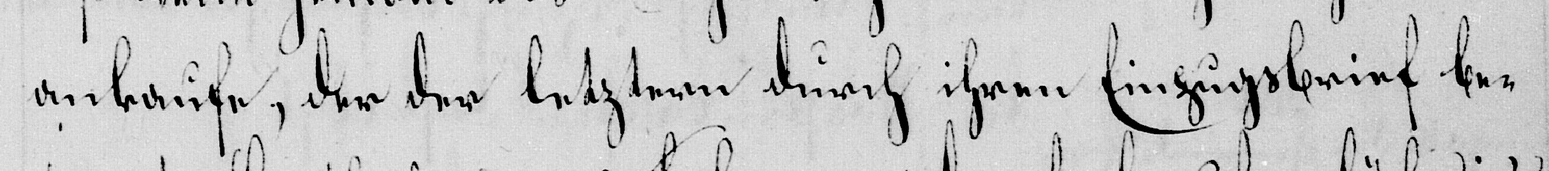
ankaufe, der der letztern durch ihren Einzugsbrief be¬
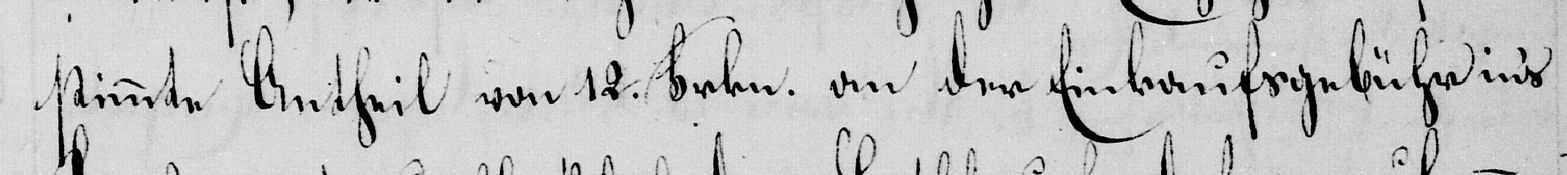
stimmte Antheil von 12. Frkn. an der Einkaufsgebühr ins
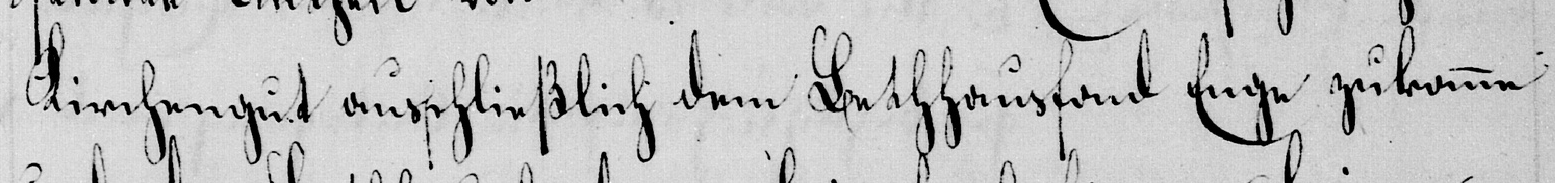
Kirchengut ausschließlich dem Bethhausfond Enge zukommen
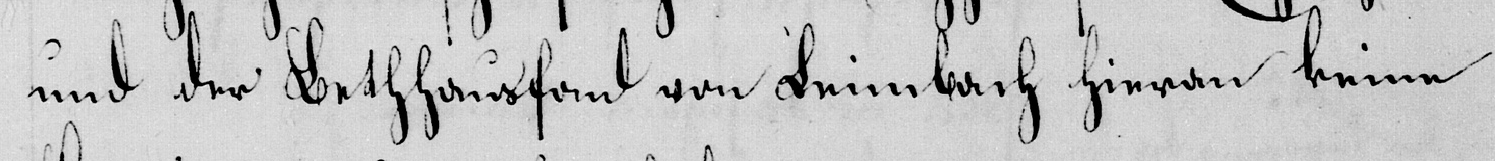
und der Bethhausfond von Leimbach hieran keine
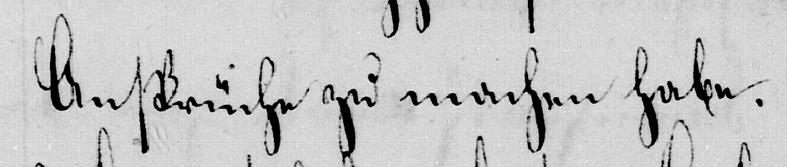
Ansprüche zu machen habe.
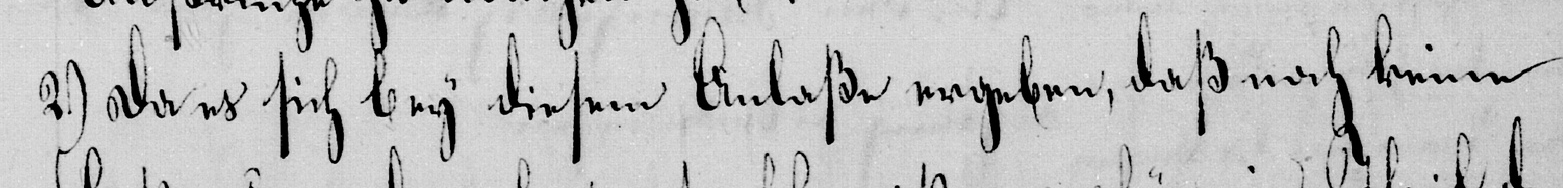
2.) Da es sich bey diesem Anlaße ergeben, daß noch keine
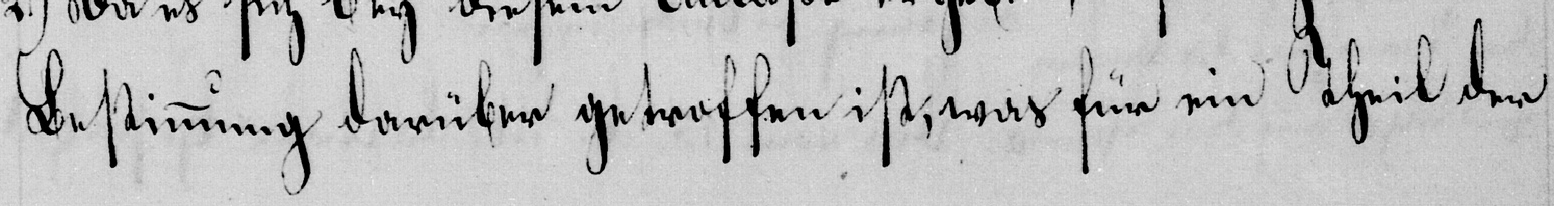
Bestimmung darüber getroffen ist, was für ein Theil der
